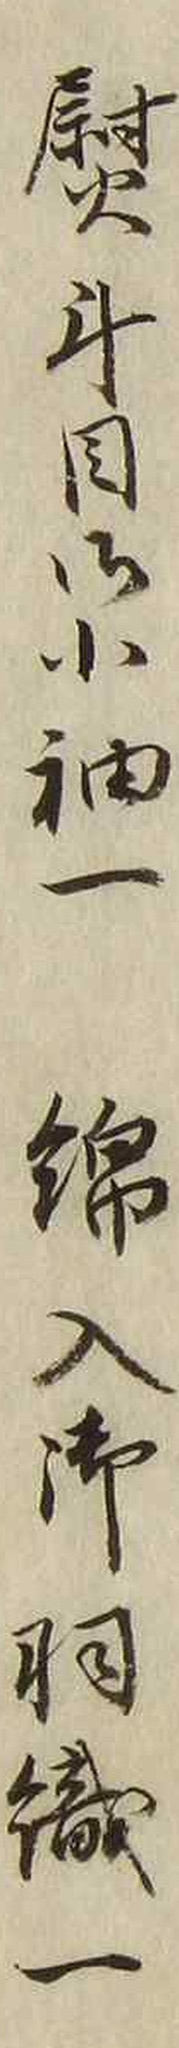熨斗目御小袖一綿入御羽織一

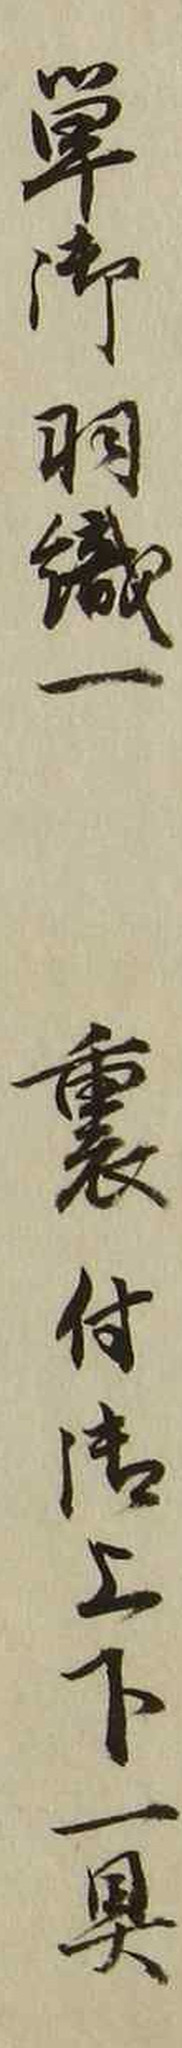単御羽織一裏付御上下一具
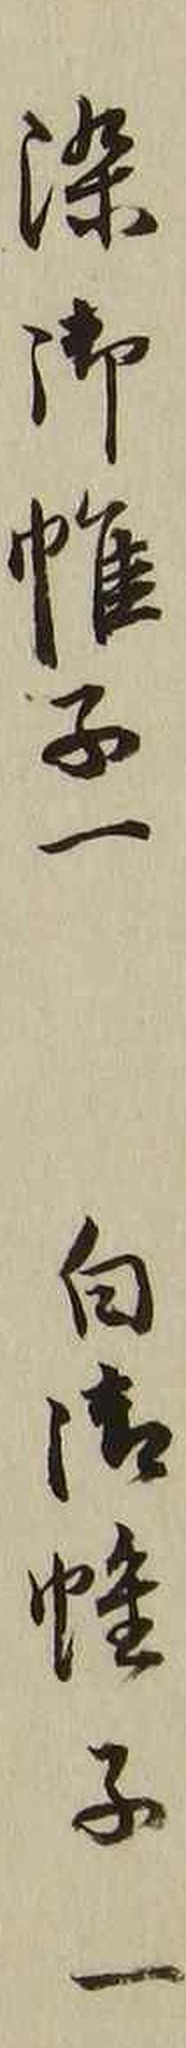染御帷子一白御帷子一
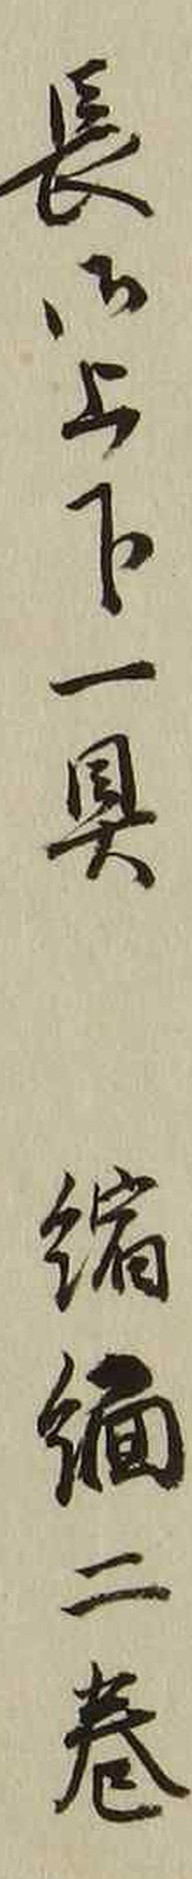長御上下一縮緬二巻
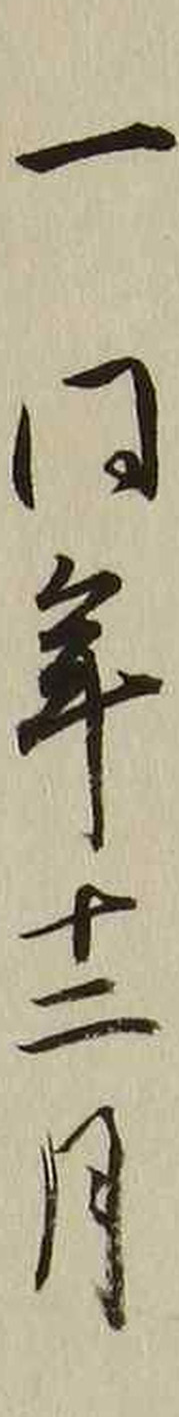一同年十二月
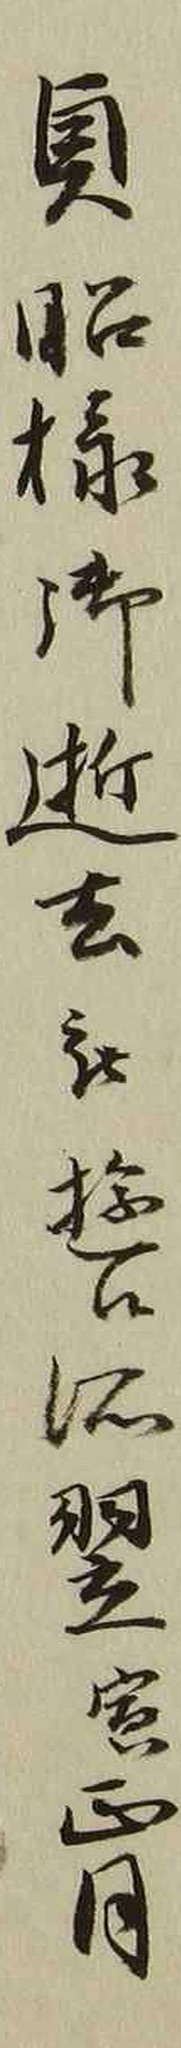貞昭様御逝去被遊候所翌寅正月
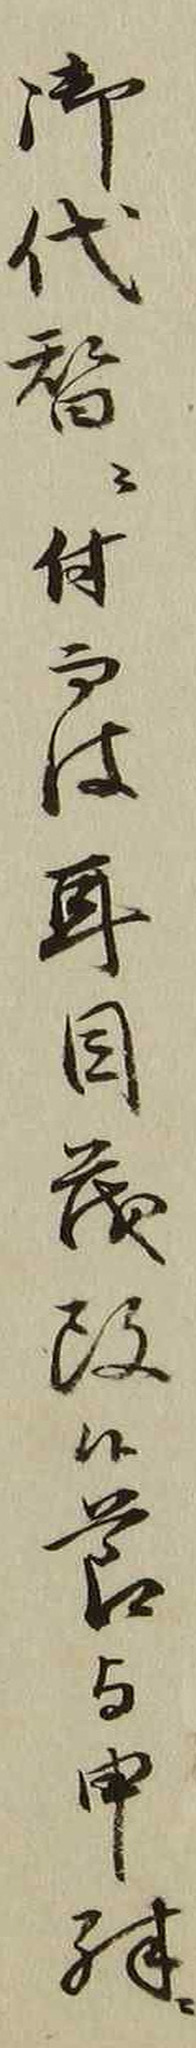御代替に付而は耳目も改候節と申殊
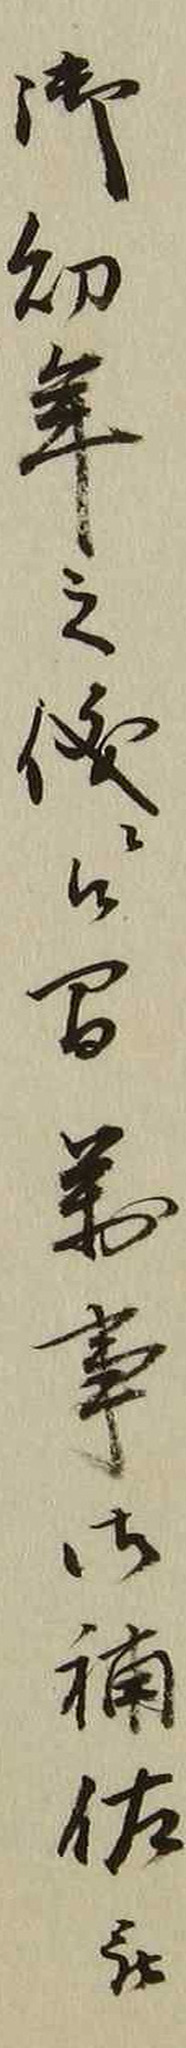御幼年之儀に候間萬事御補佐被
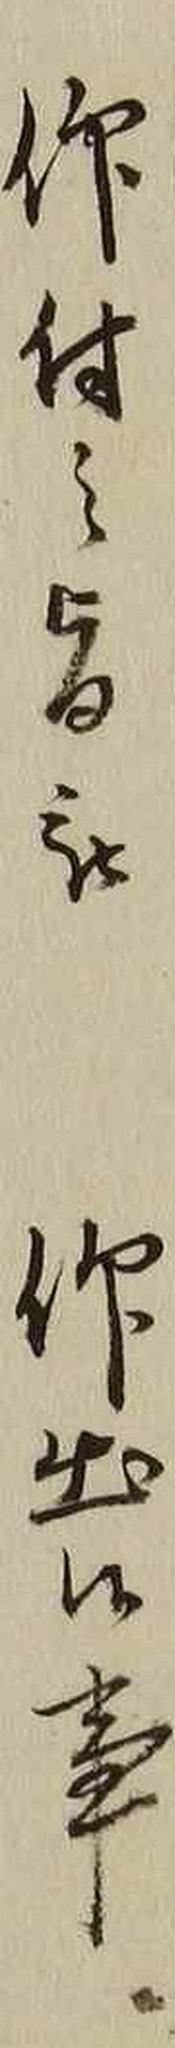仰付之旨被仰出候事
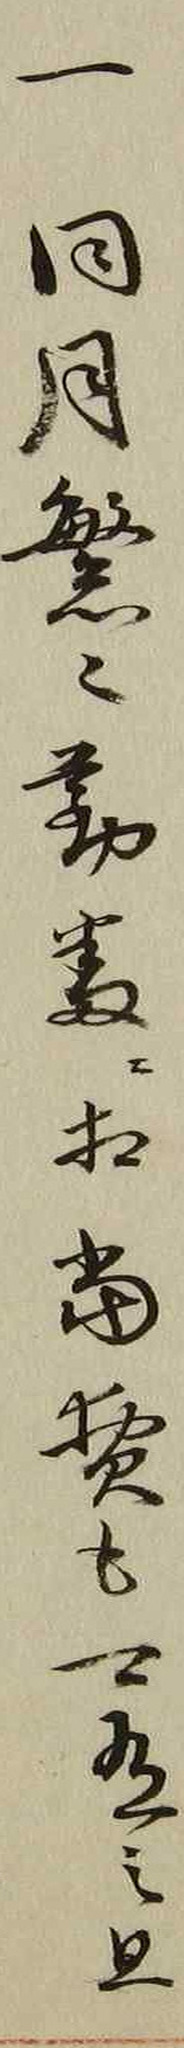一同月繁々勤番に相当費も可有之且
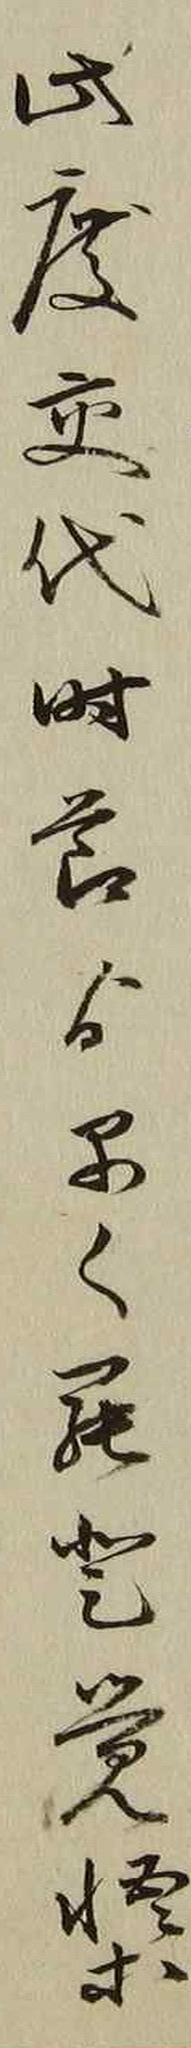此度交代時節ゟ早く罷登覚悟等
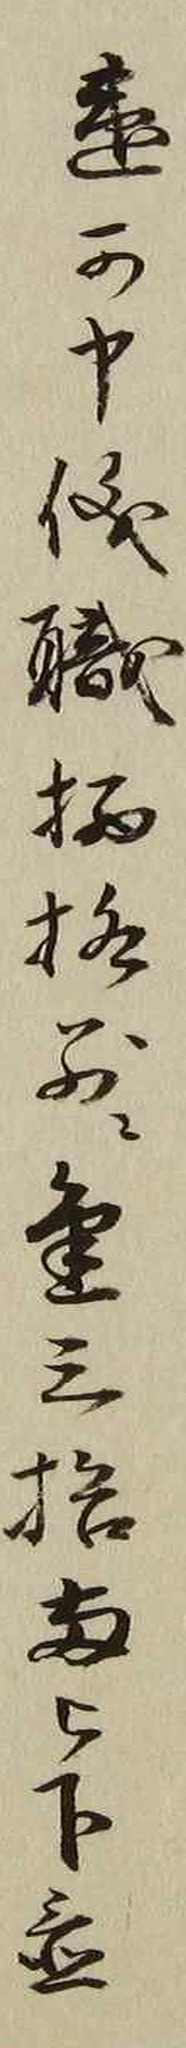遣可申儀職柄格別に金三拾両被下置
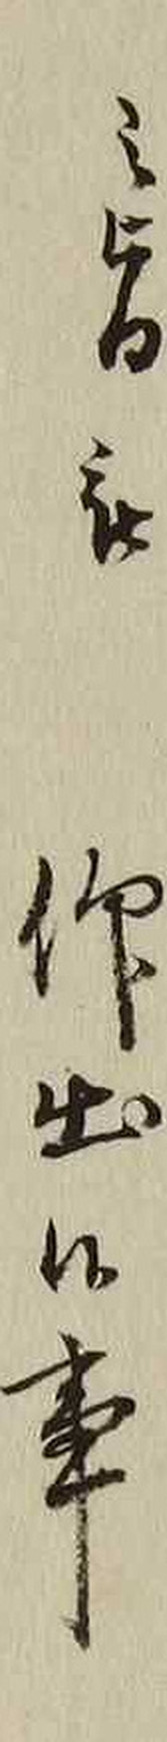之旨被仰出候事
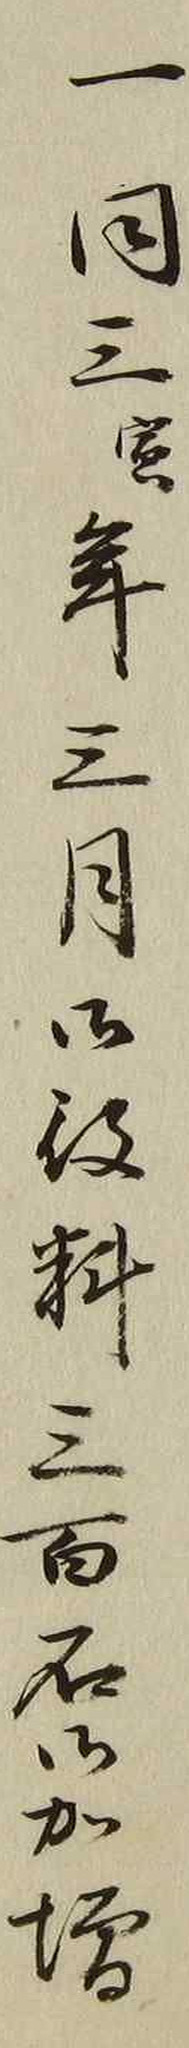一同三寅年三月御役料三百石御加増
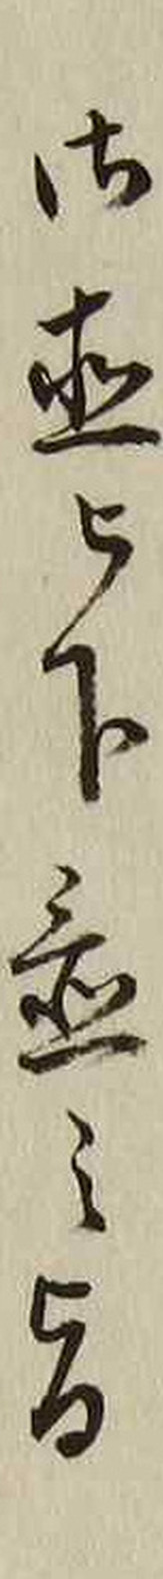御直被下置之旨
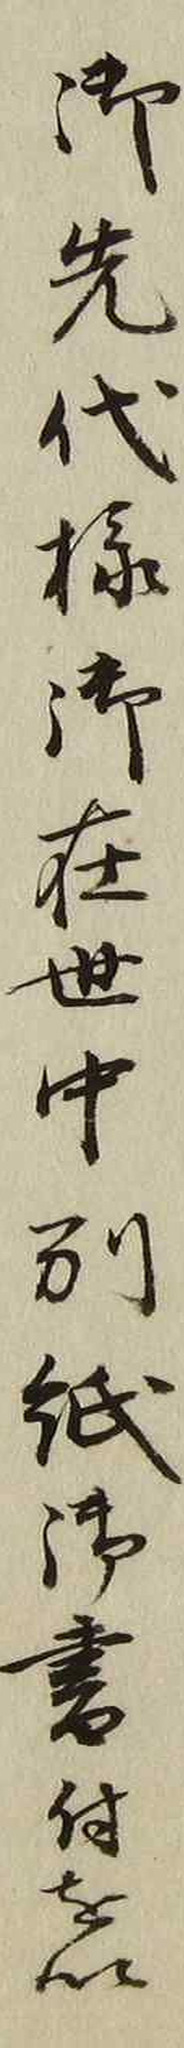御先代様御在世中別紙御書付を以
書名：諸士系譜　巻之125　た之部1
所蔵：会津若松市立会津図書館
